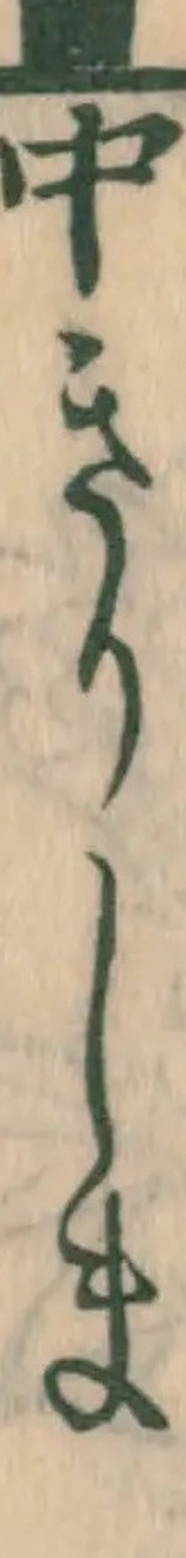中きりしま
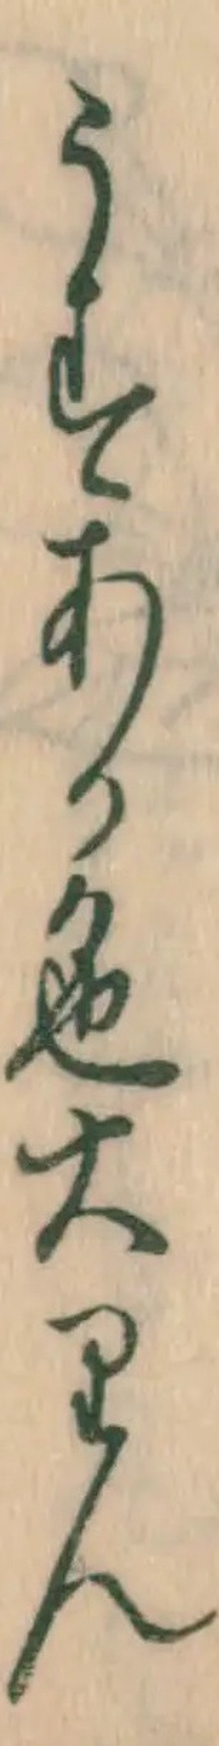うすあか色大りん
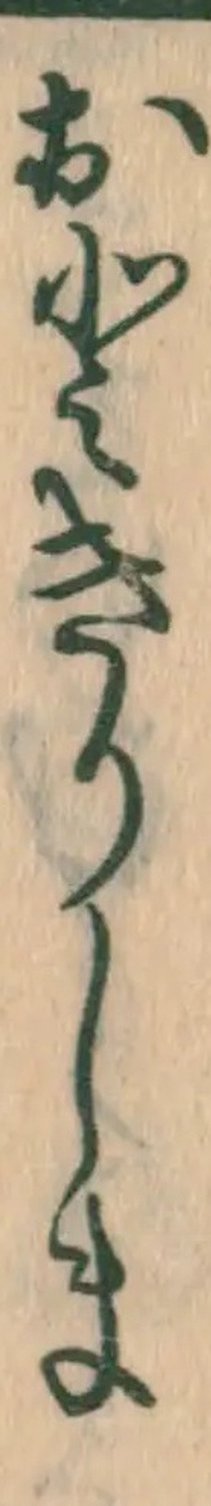おときりしま
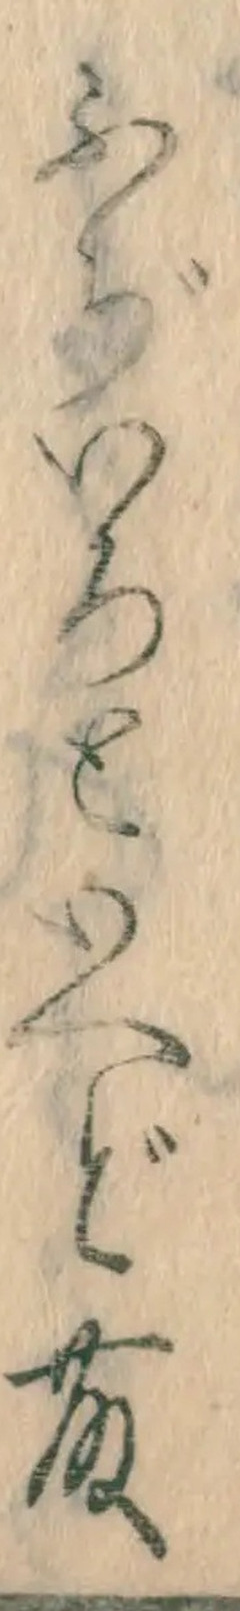ふぢいろといへど藤
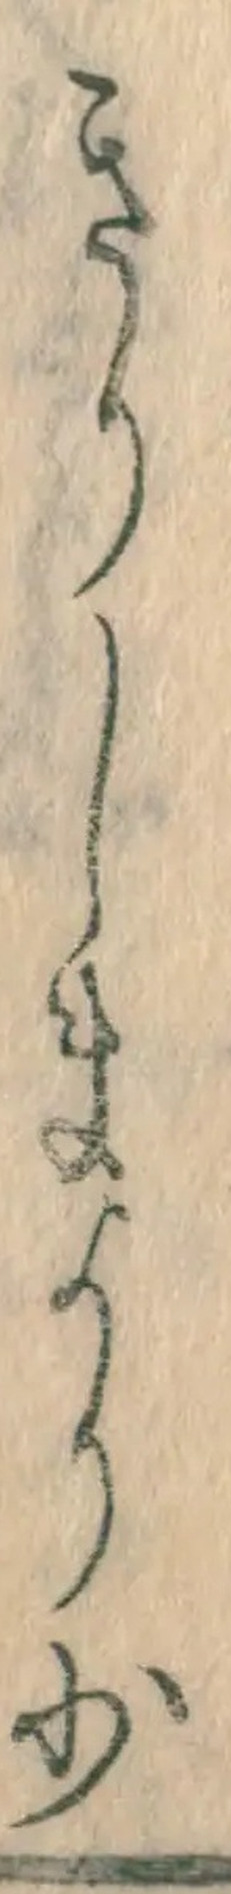きりしまより少
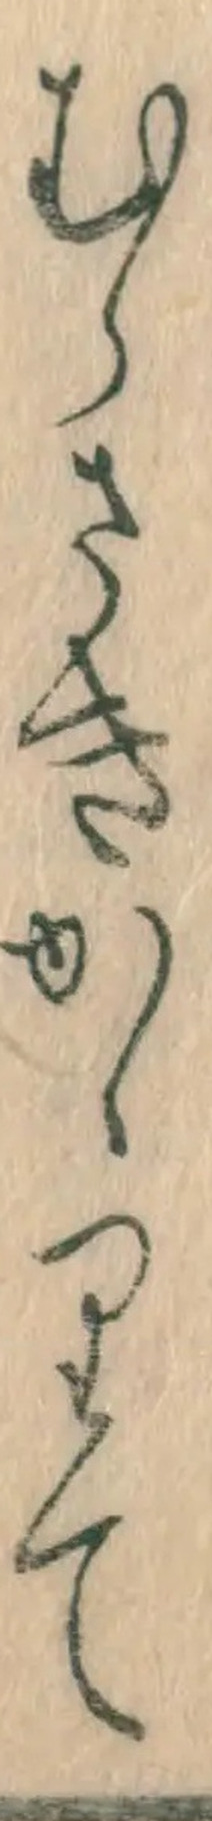むらさきかゝりて
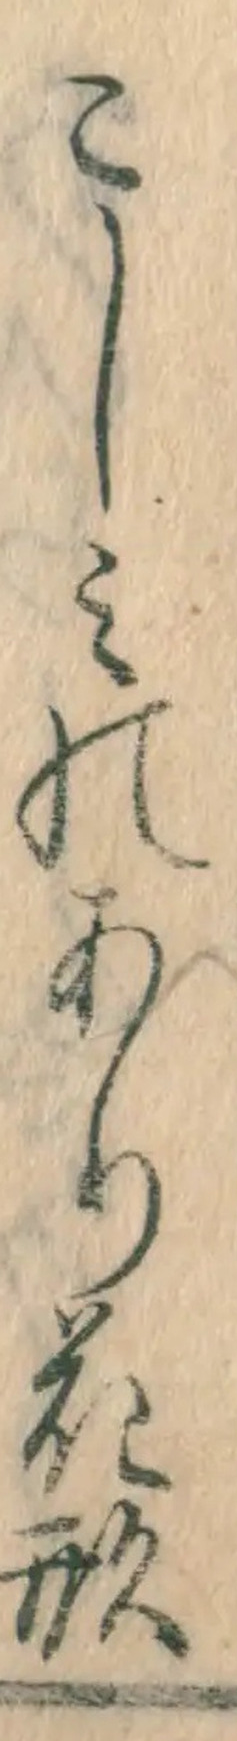こしみのあり花形

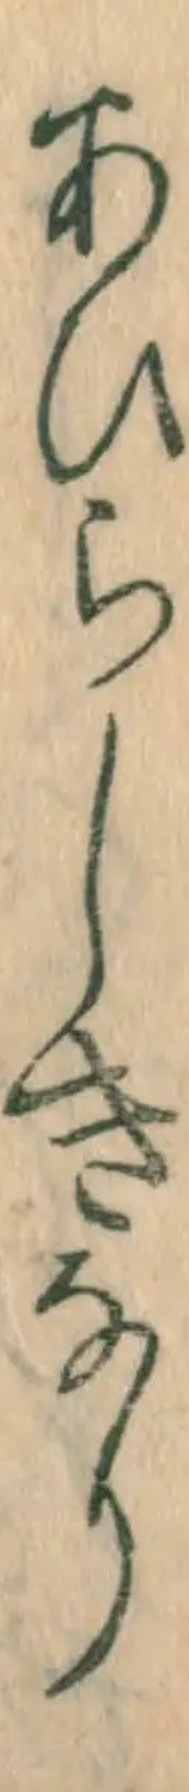あひらしきなり
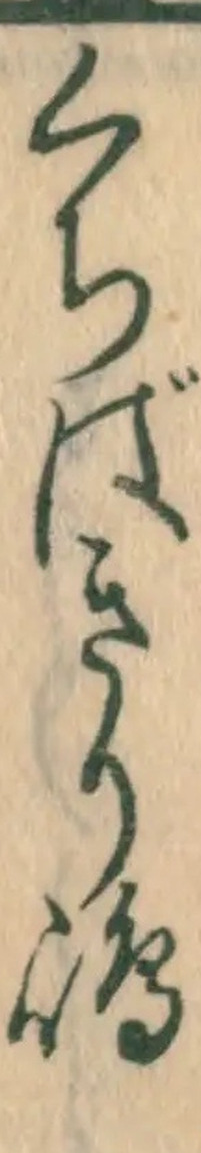▲くちばきり嶋
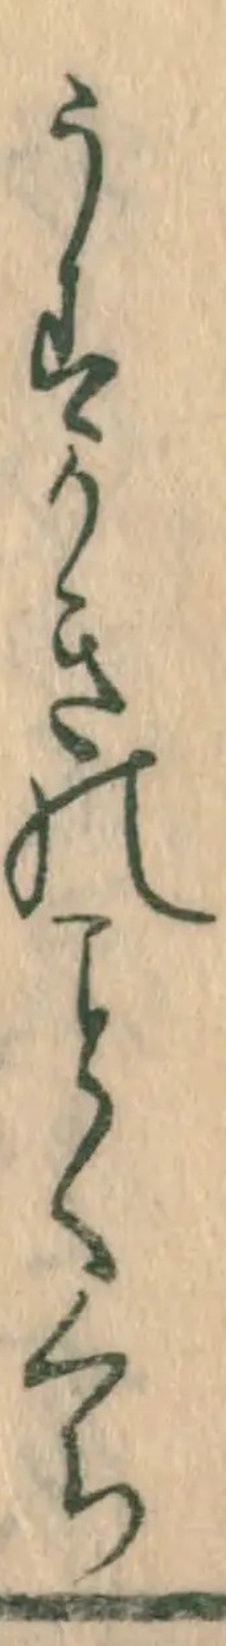うすかきのことくくち
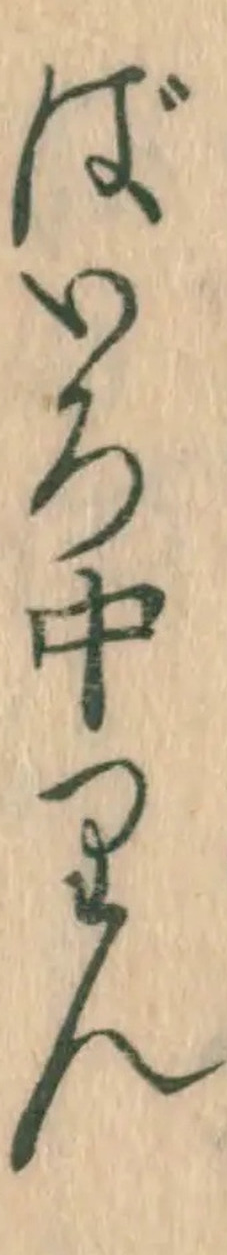ばいろ中りん
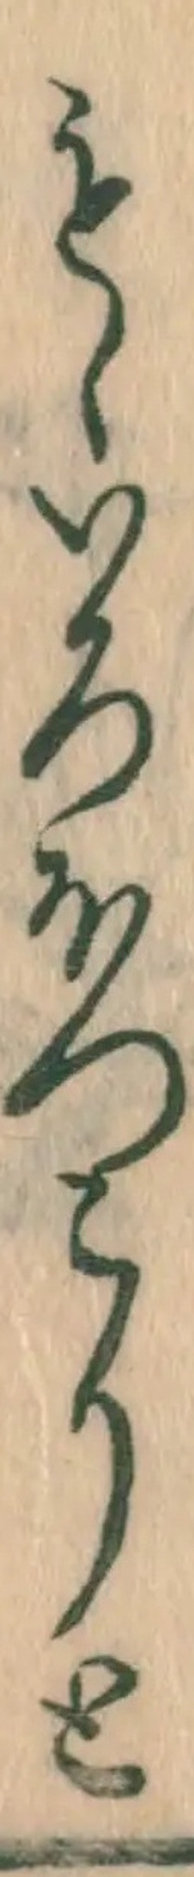もゝいろほつこりと
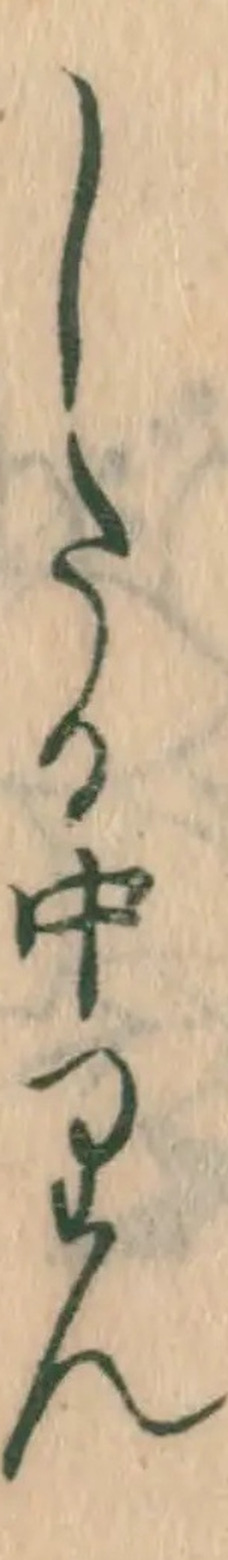したる中りん
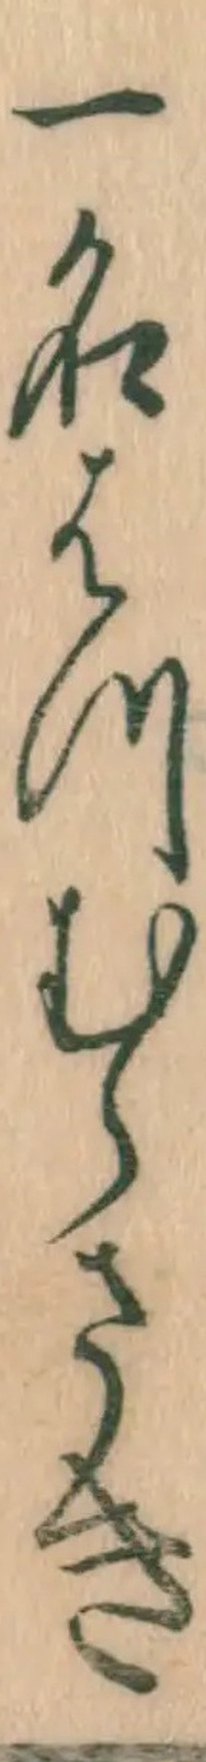一名はつむらさき
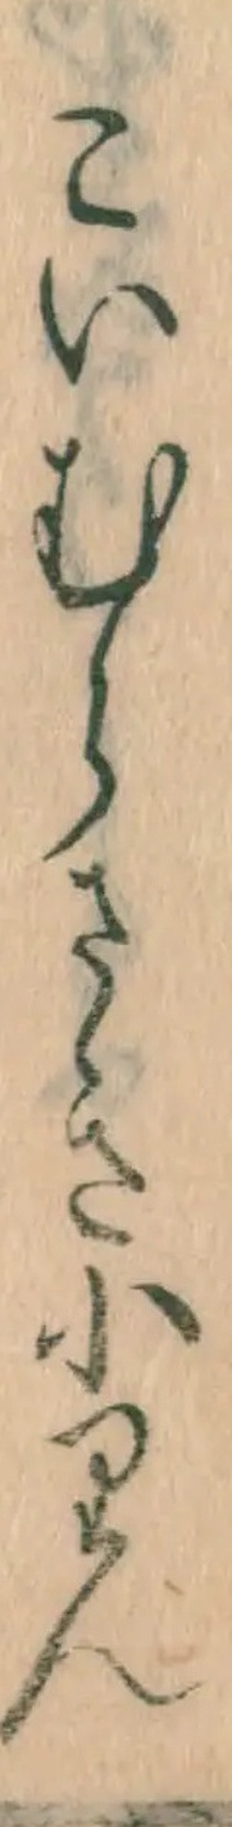こいむらさき小りん
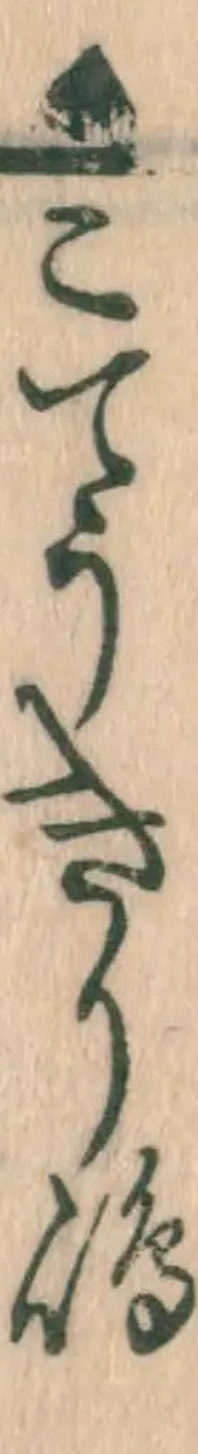▲こてうきり嶋
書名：錦繍枕 5巻. [1]
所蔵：国立国会図書館 National Diet Library, JAPAN
